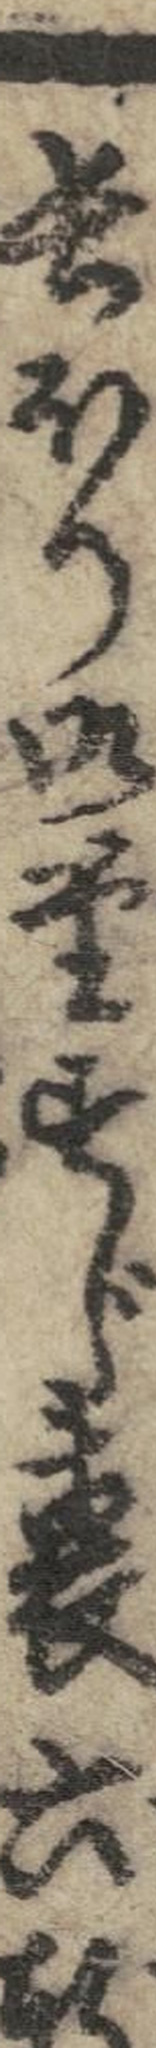長ほり御堂すじ裏六軒
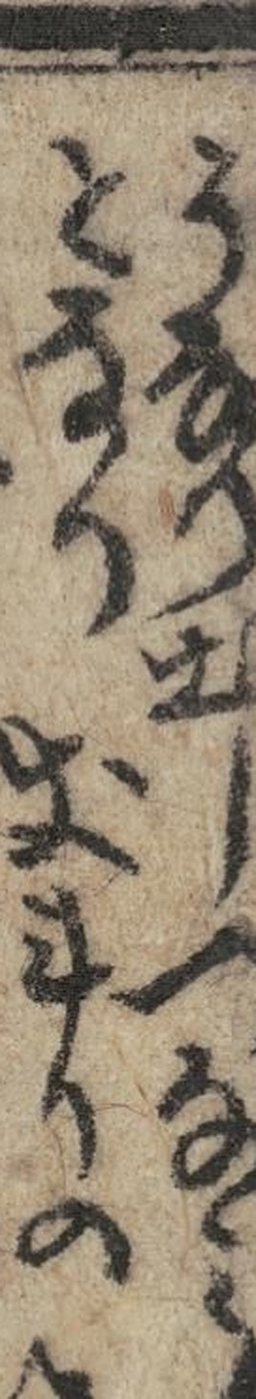となり丈計りの
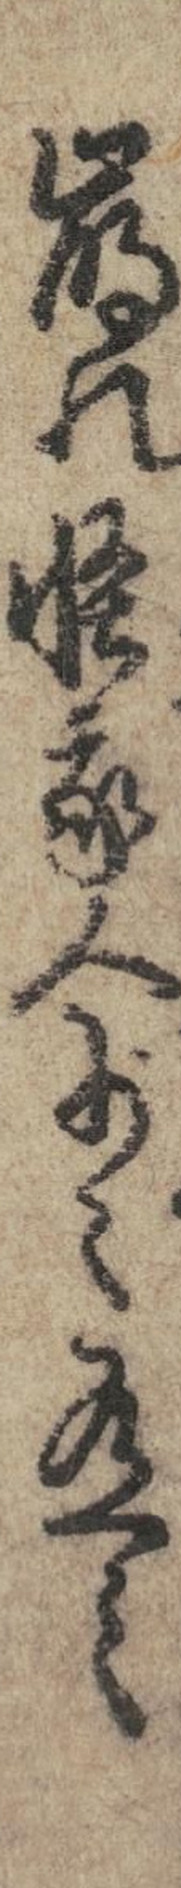崩れ怪家人少〻有之
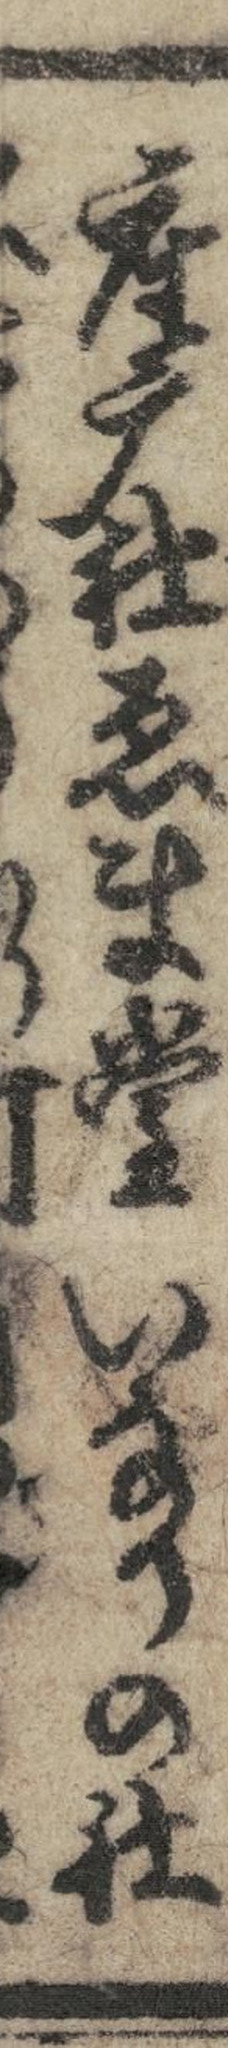座摩社ゑま堂いなりの社
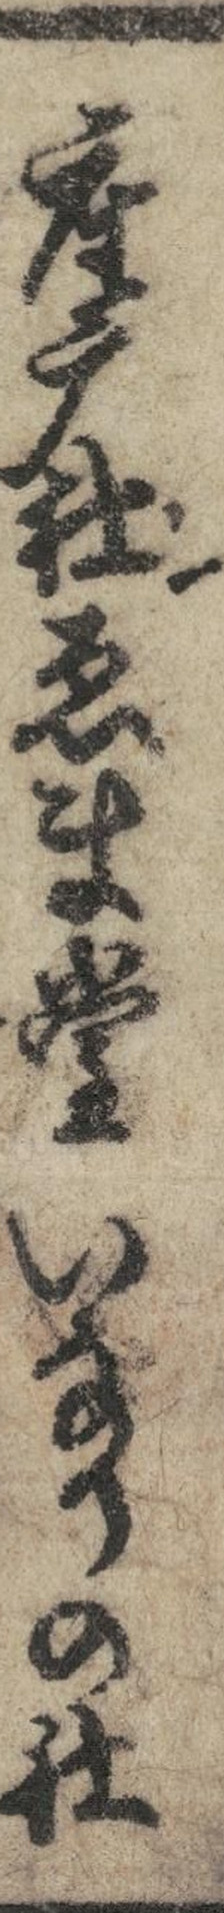座摩社ゑま堂いなりの社
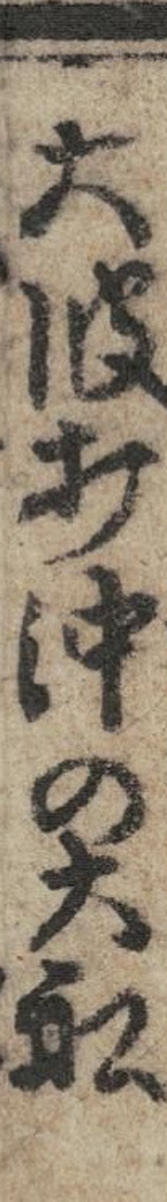大波打沖の大船
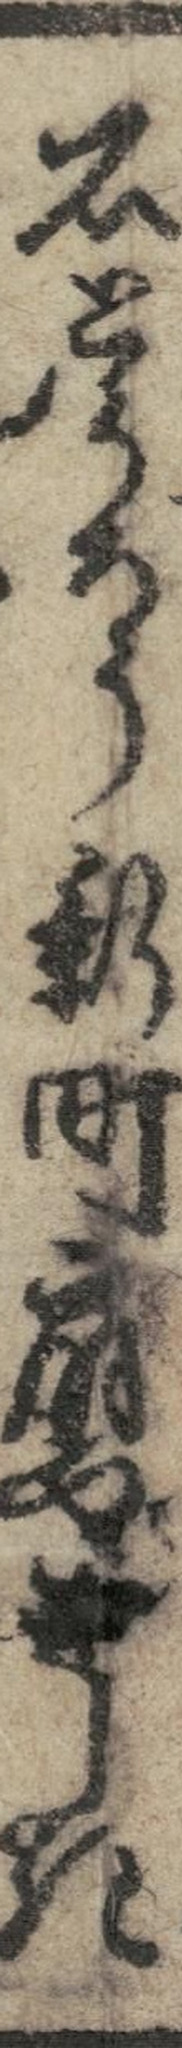石とうろう新町崩やしき
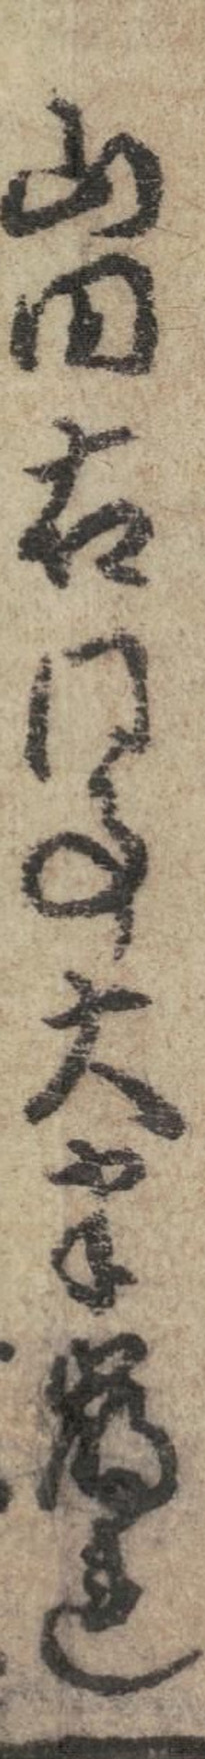山田右同事大半崩れ
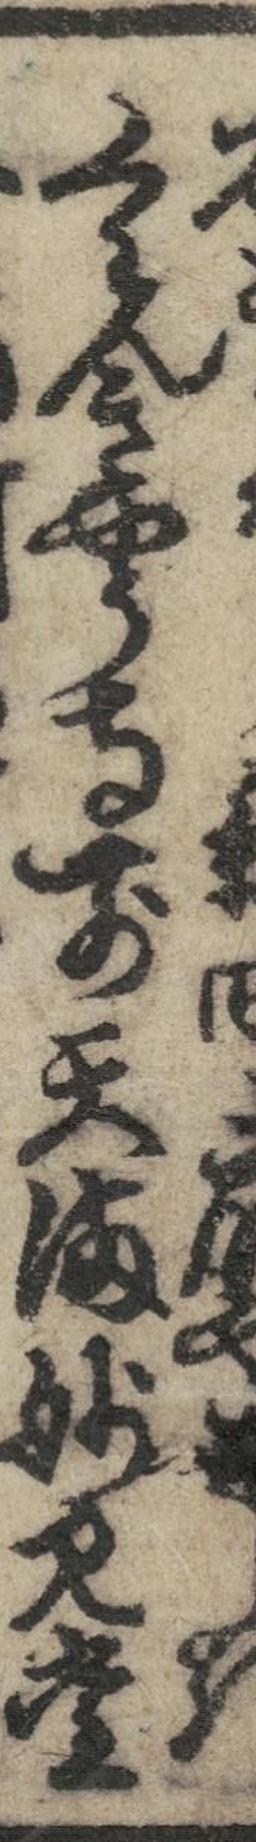くわんきやう寺前天満妙見堂
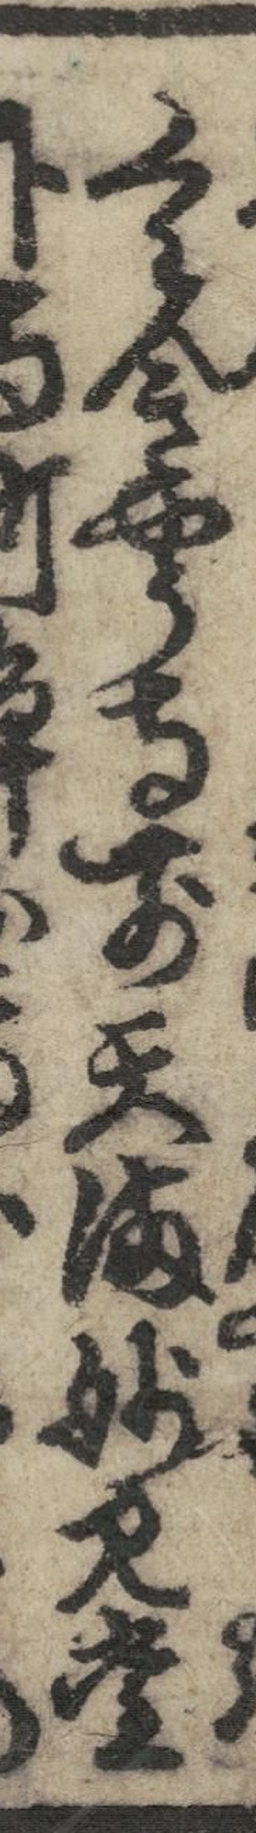くわんきやう寺前天満妙見堂
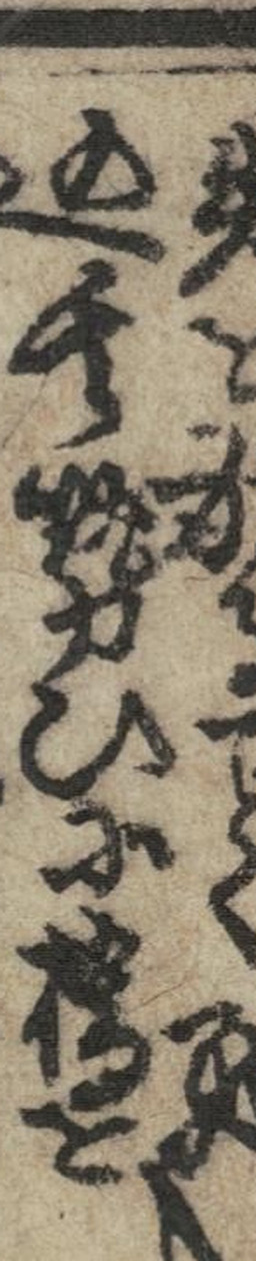込其勢ひに橋を
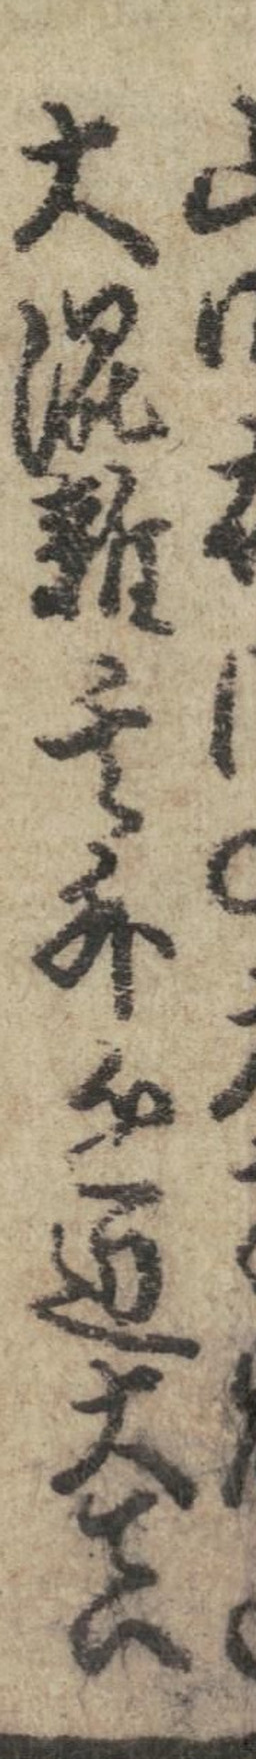大混雑其外近辺大てい
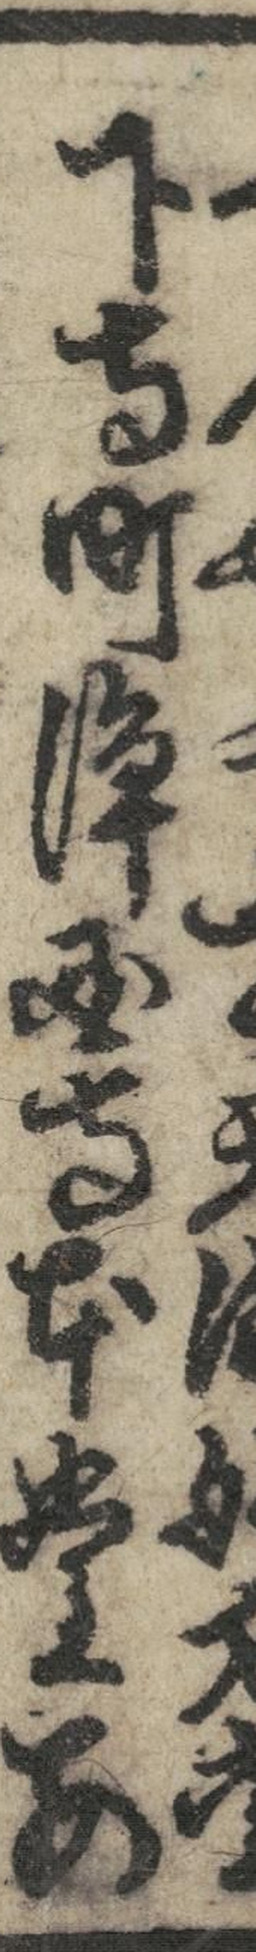下寺町漳国寺本堂あ
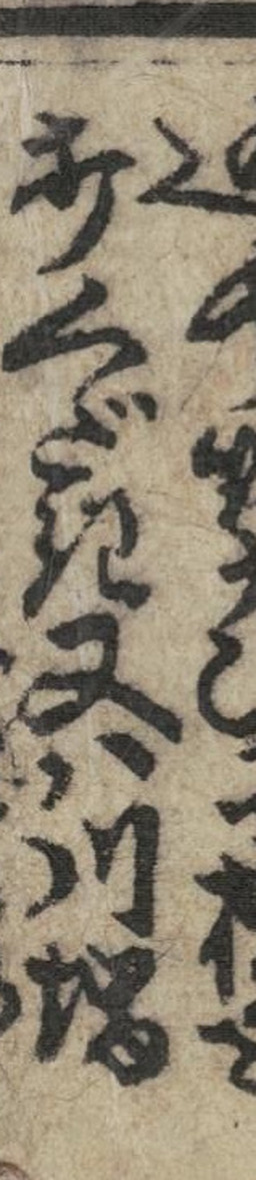打くだき又ハ川場
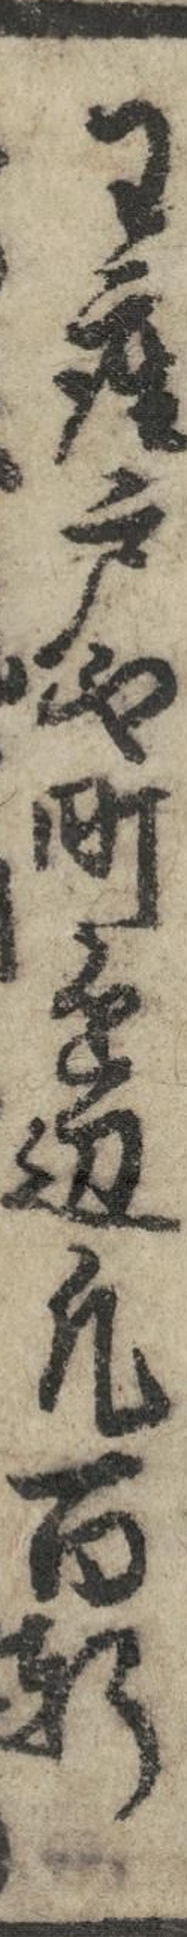わ座戸や町近辺凡百軒計り
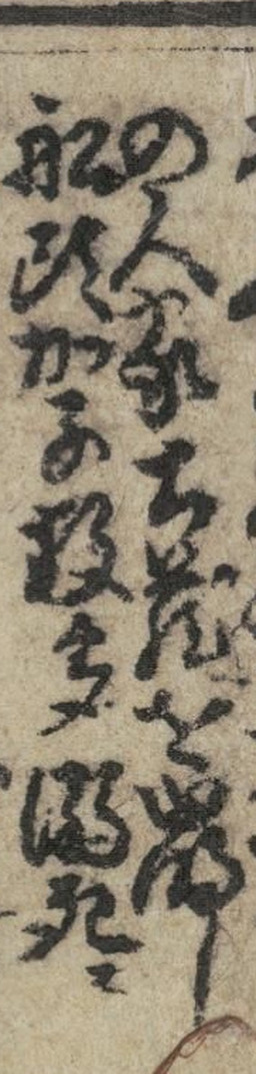船頭加子数多溺死ス
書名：諸国大阪太地震大つなミ末代噺
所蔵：東京大学地震研究所図書室 Earthquake Research Institute Library, The University of Tokyo, JAPAN
